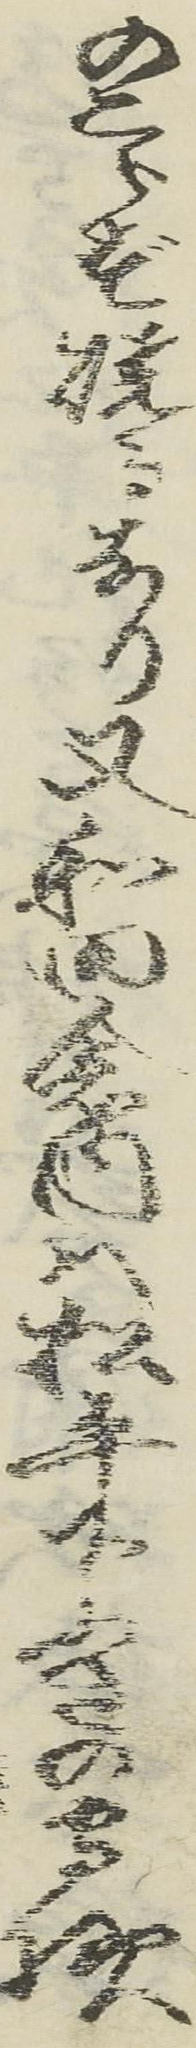のこらず焼るなり又和田倉門は松平下ふさの守様
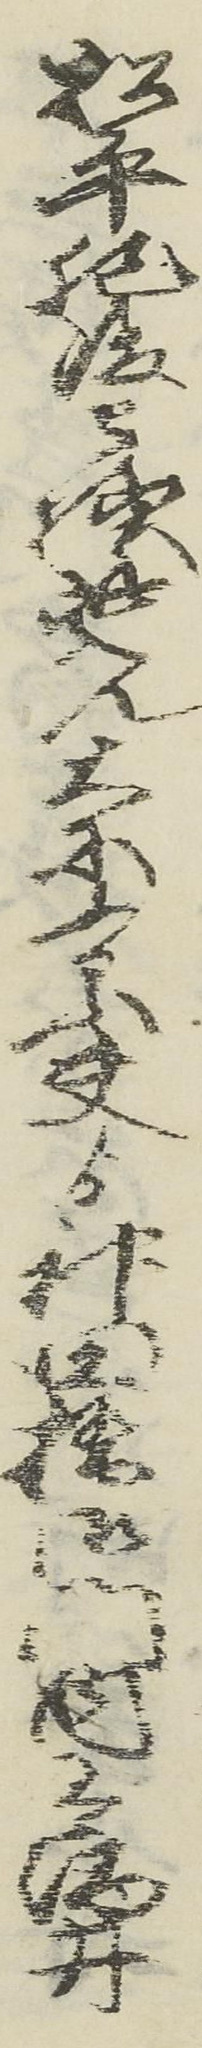松平肥後守様此へん大にふるふ夫ゟ神田橋御門内は酒井

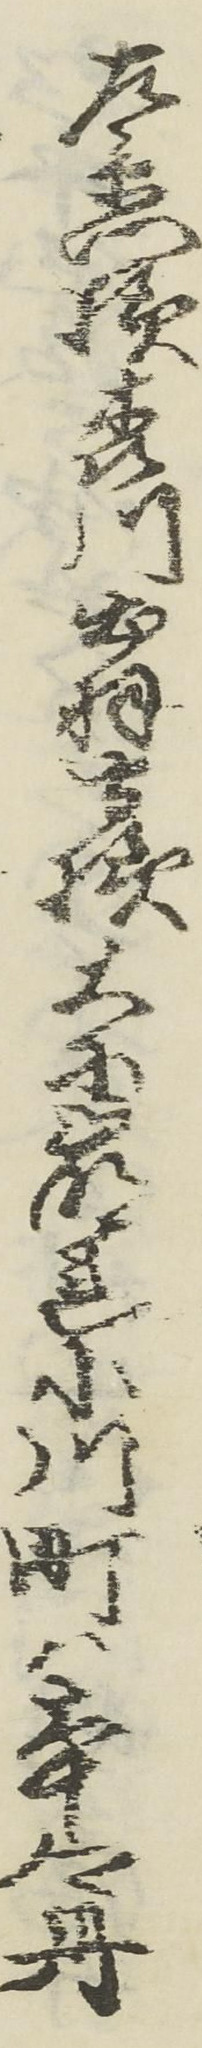左衛門様森川出羽守様大に崩れ小川町は本郷丹
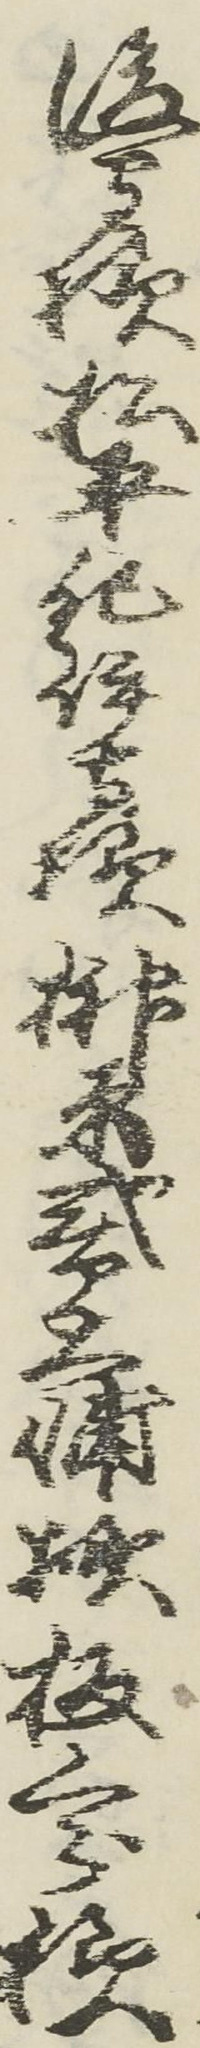後守様松平紀伊守様榊原式部大輔様板くら様
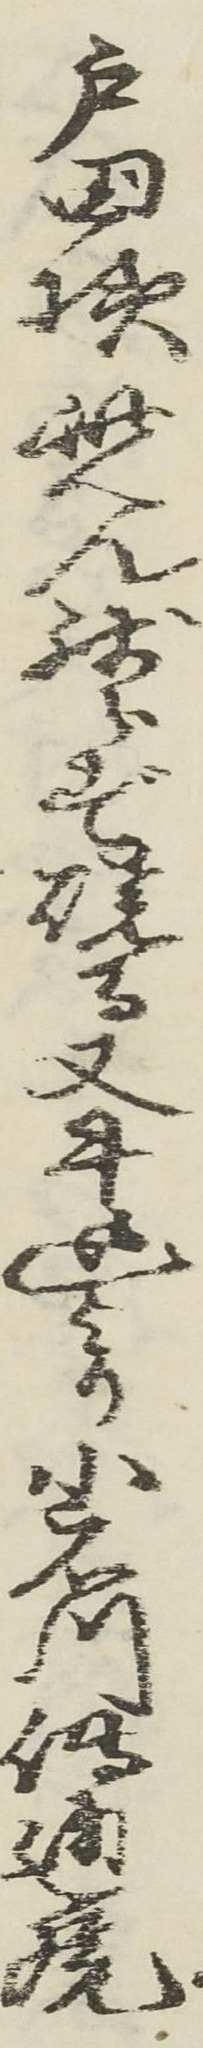戸田様此へん残らず焼る又牛込より小石川伝通院
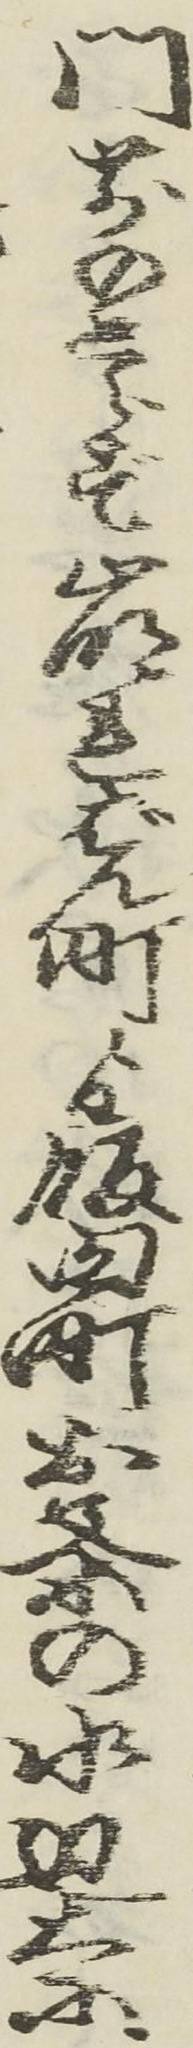門前のこらず崩ればん町ゟ飯田町お茶の水辺大に
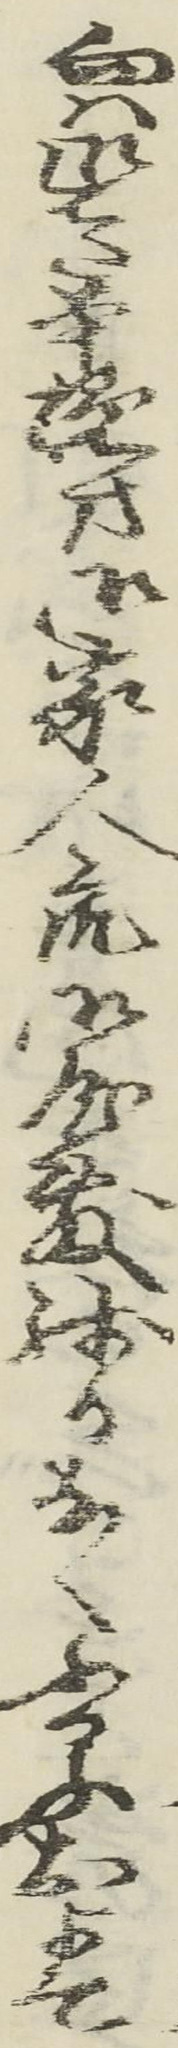向は御はた本方御家人衆御屋敷残りなくふるふおよそ
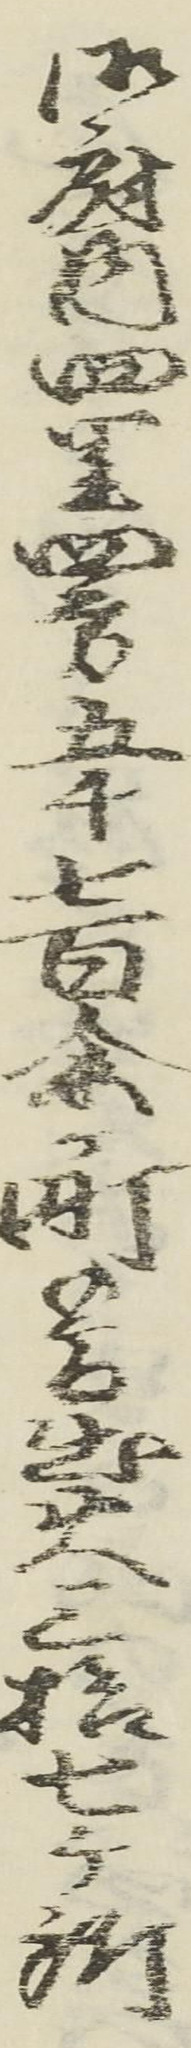御府内四里四方五千七百余ヶ町の間出火三拾七ケ所
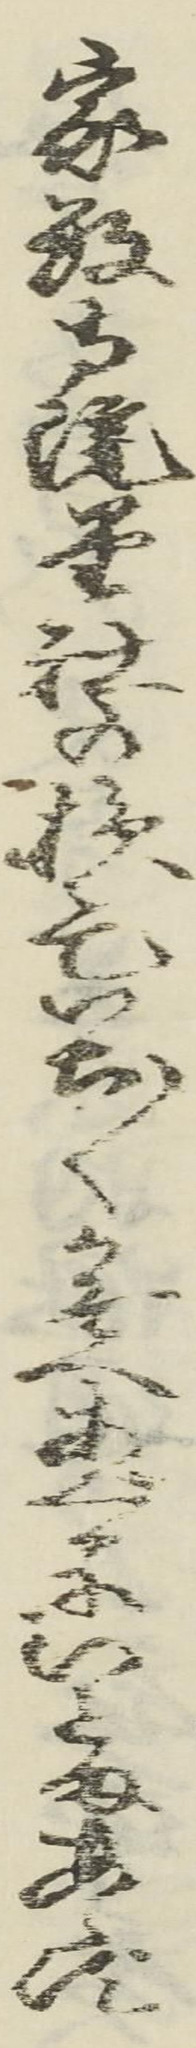家数寺院堂社の損亡いち〳〵かぞへあぐるにいとまあらず
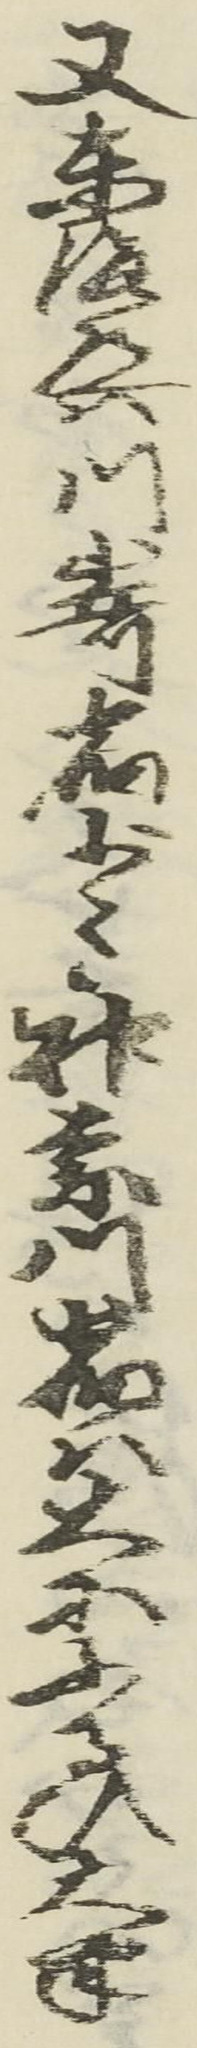又東海道は川崎宿少〻神奈川宿は大にふるひ大半
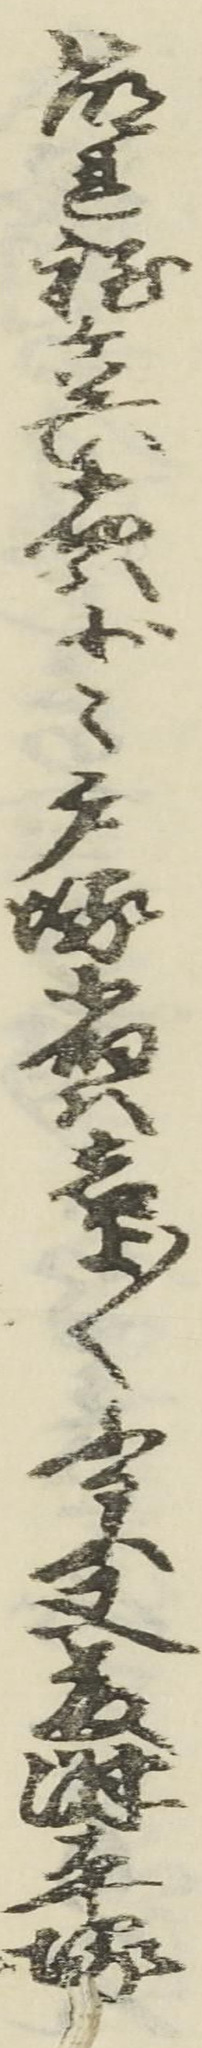崩れ程ヶ谷宿は少〻戸塚宿はしよ〳〵ふるふ又藤沢平塚
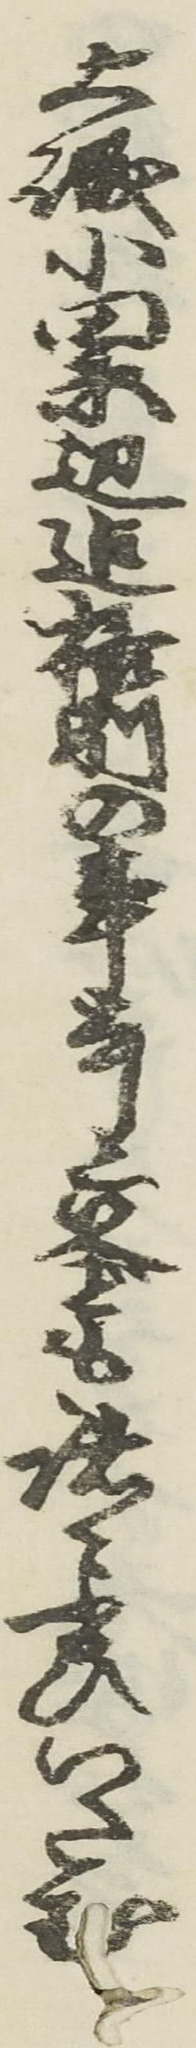大磯小田原辺迄格別の事なしといへども諸〻ふるひいたむ
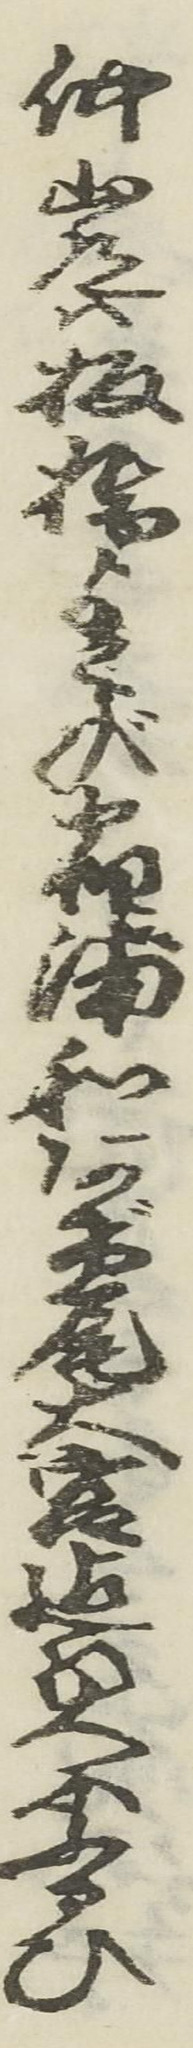仲山道は板橋ゟわらび宿浦和あげ尾大宮迄は大にふるひ
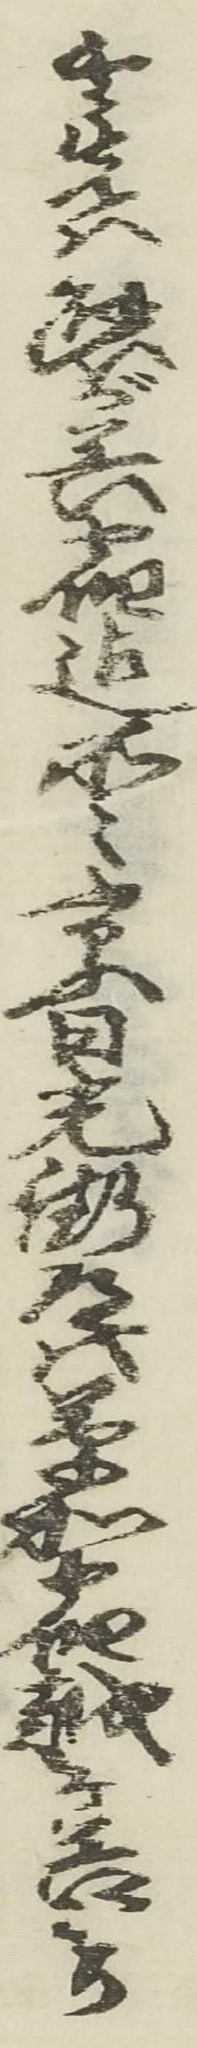其先は熊が谷宿迄所〻ふるふ日光街道は草加宿越ケ谷より
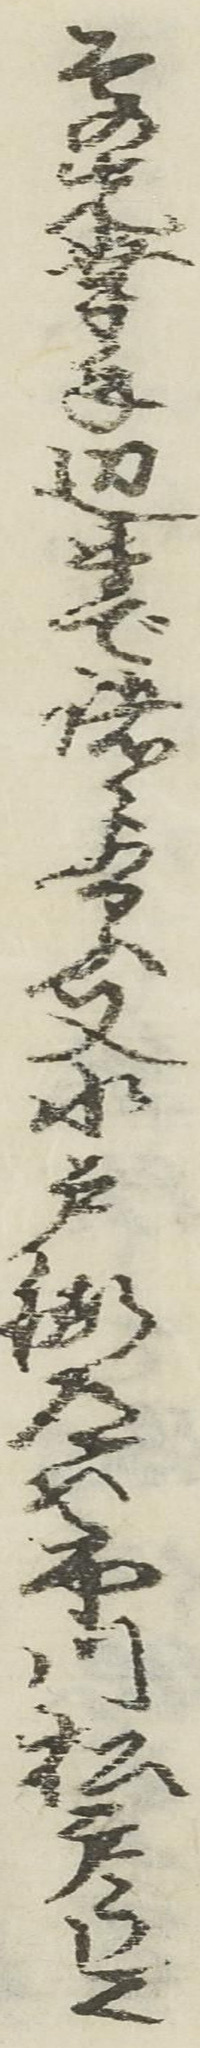その先幸手辺まで諸〻ふるふ又水戸街道は市川松戸うしく
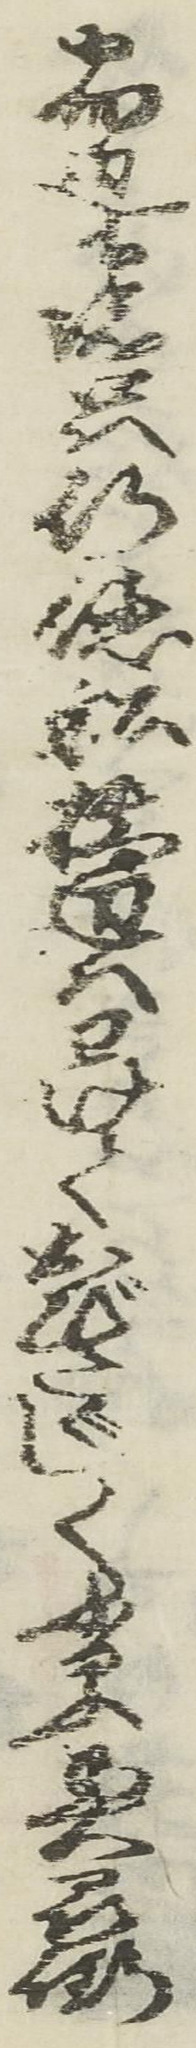宿辺市口は行徳船橋辺はわけておびたゞしくふるふ奥州街
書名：安政乙卯江戸大地震筆記　安政丙辰八月大阪大雷雨之記追加　安政三辰年七月松前辺大地震并八月大風雨記録
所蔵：東京大学地震研究所図書室 Earthquake Research Institute Library, The University of Tokyo, JAPAN
